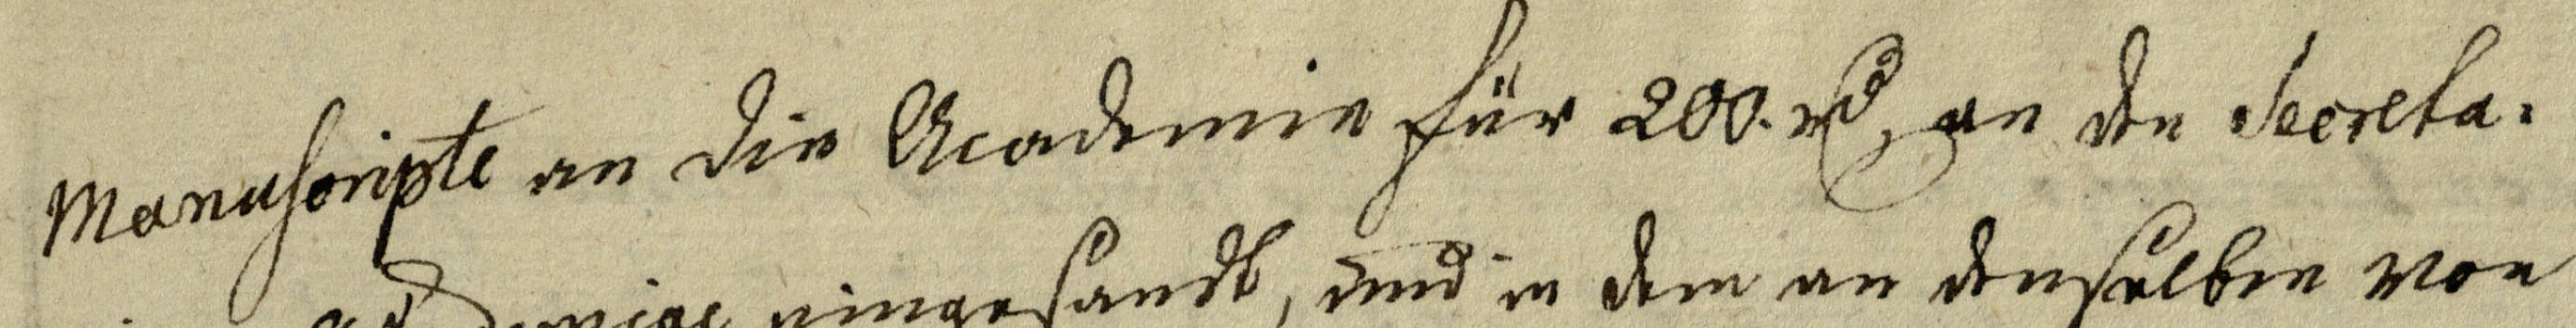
Manuscripte an die Academie für 200 r. an den Secreta¬
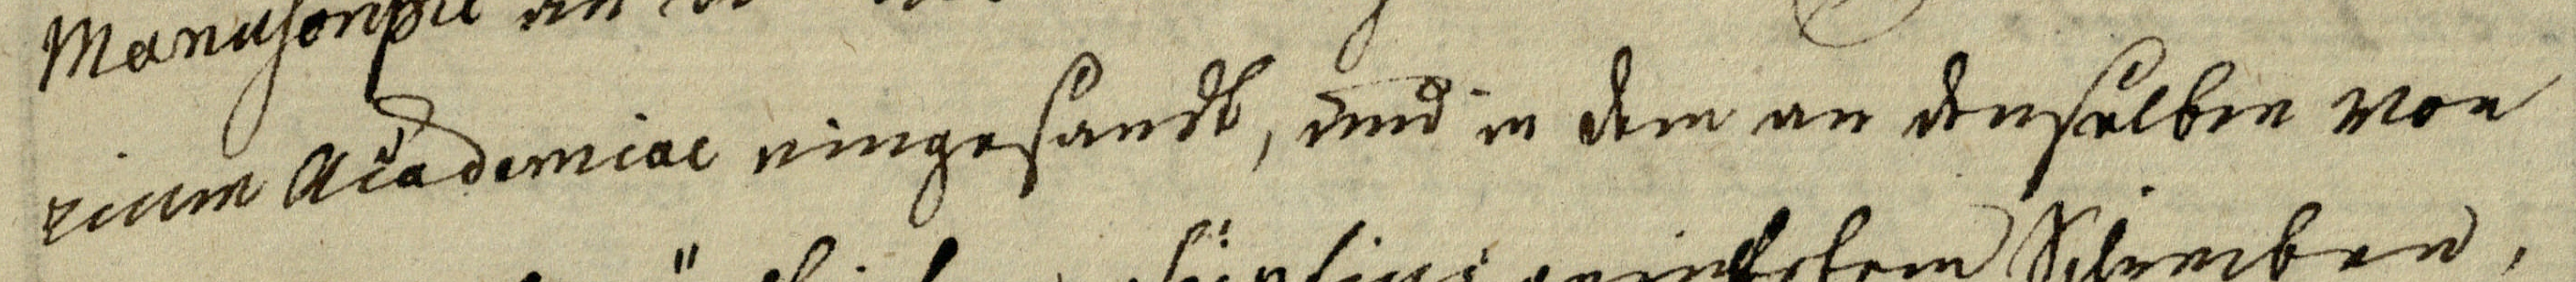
rium Academiae eingesandt, und in dem an denselben von
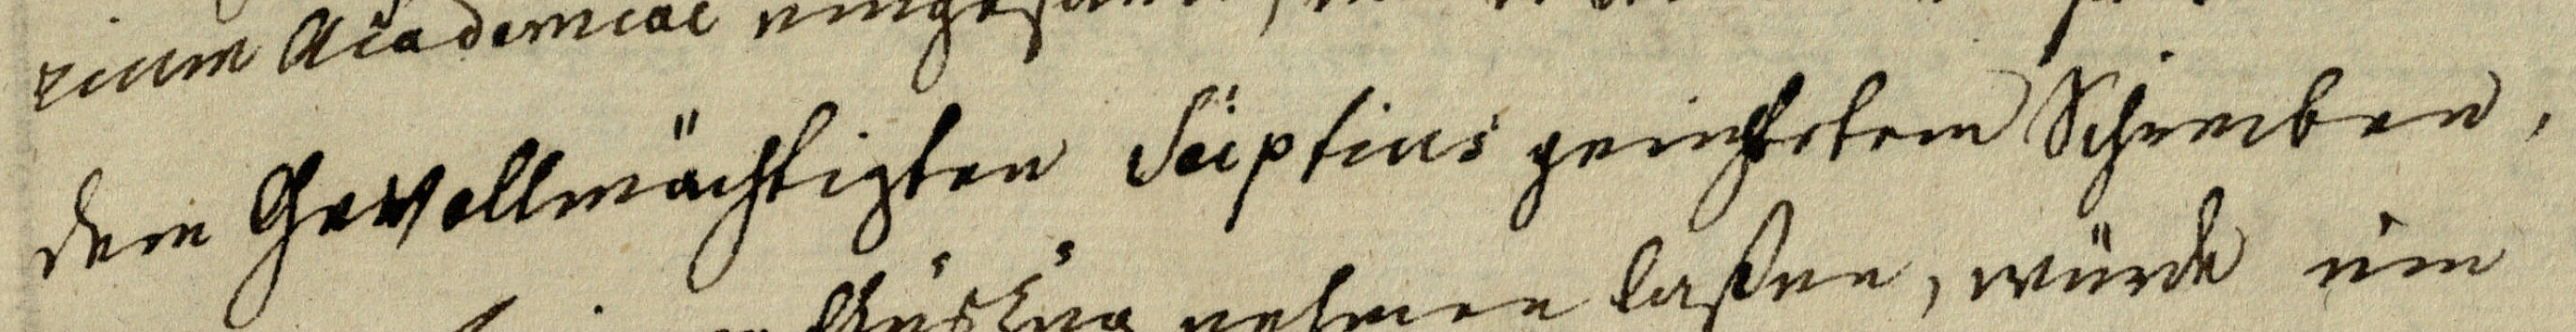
dem Gevollmächtigten Seiptius gerichtetem Schreiben,
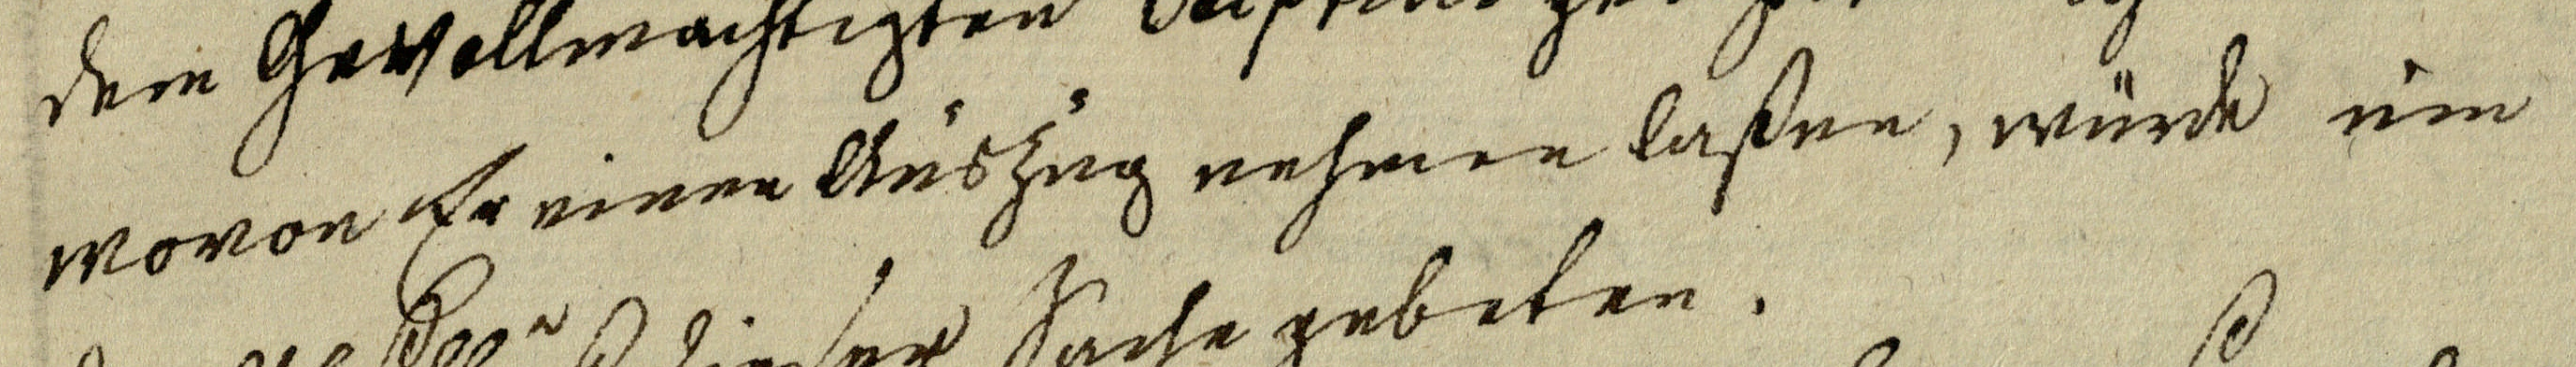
wovon Er einen Auszug nehmen laßen, würde um
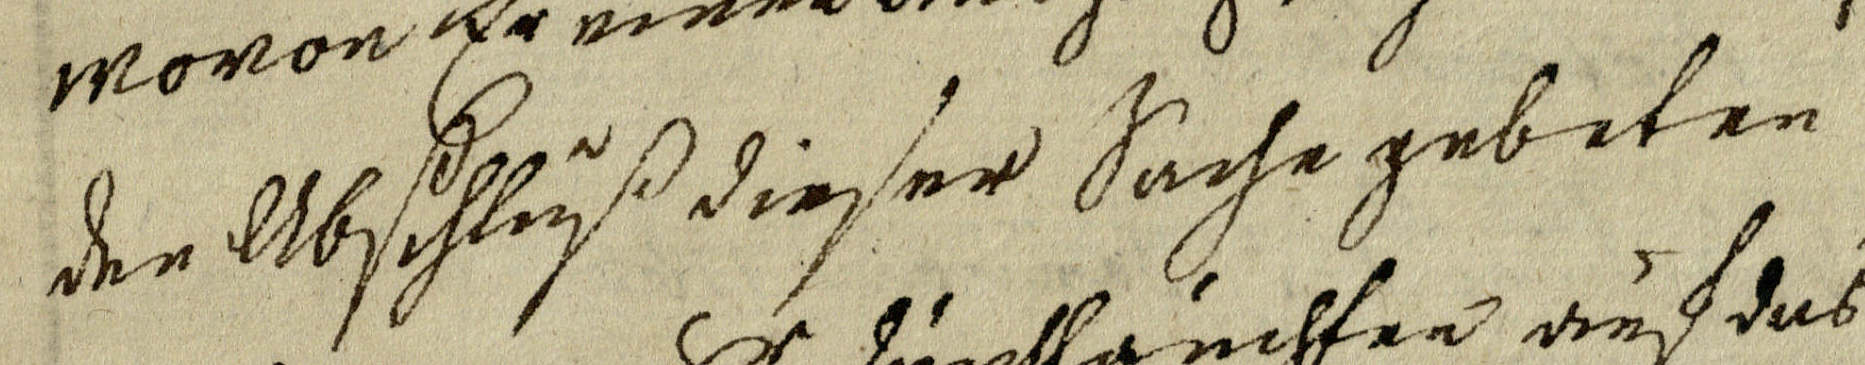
den Abschluß dieser Sache gebeten.
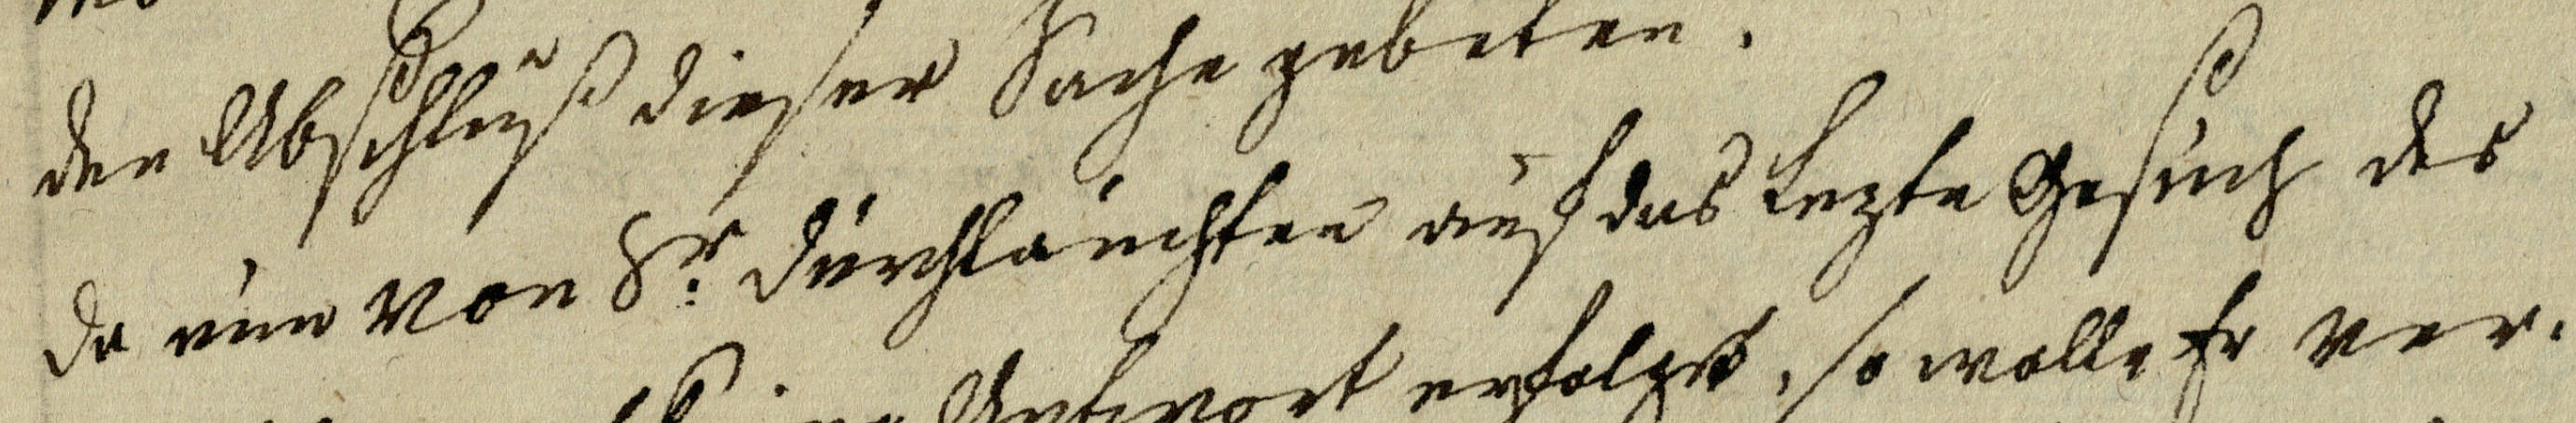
da nun von Sr Durchlauchten auf das lezte Gesuch des
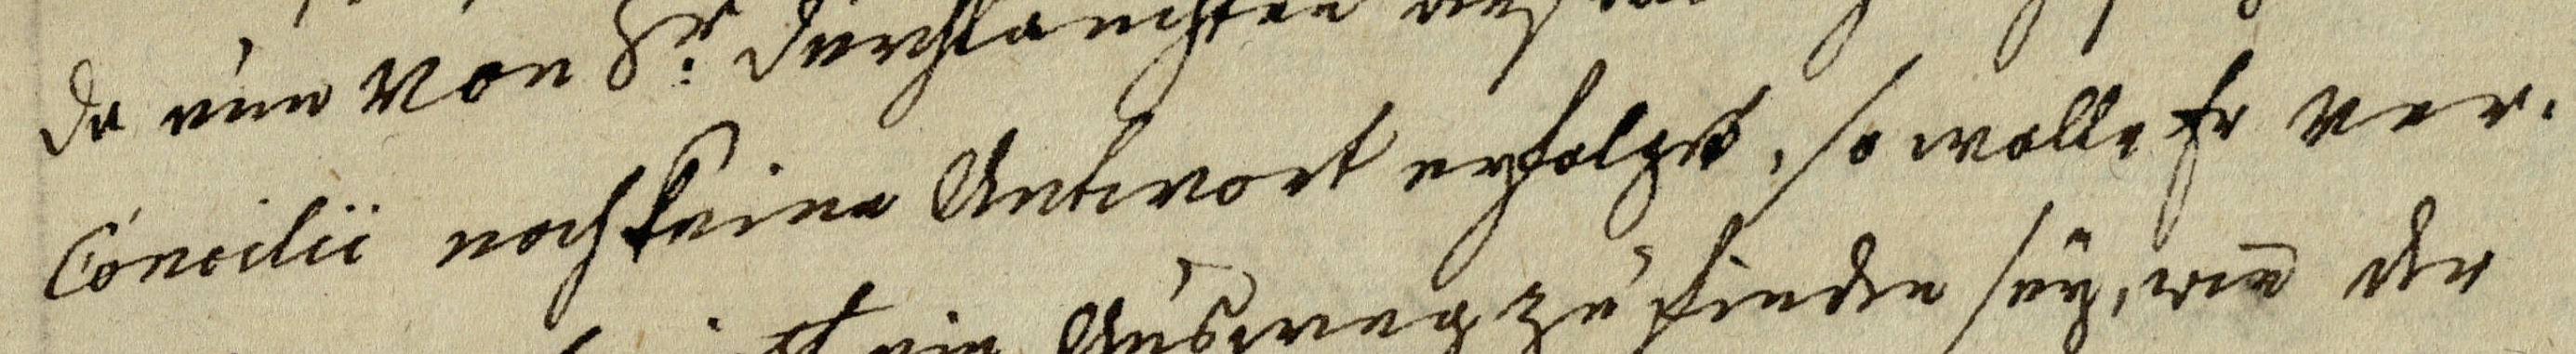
Concilii noch keine Antwort erfolget, so wolle Er ver¬
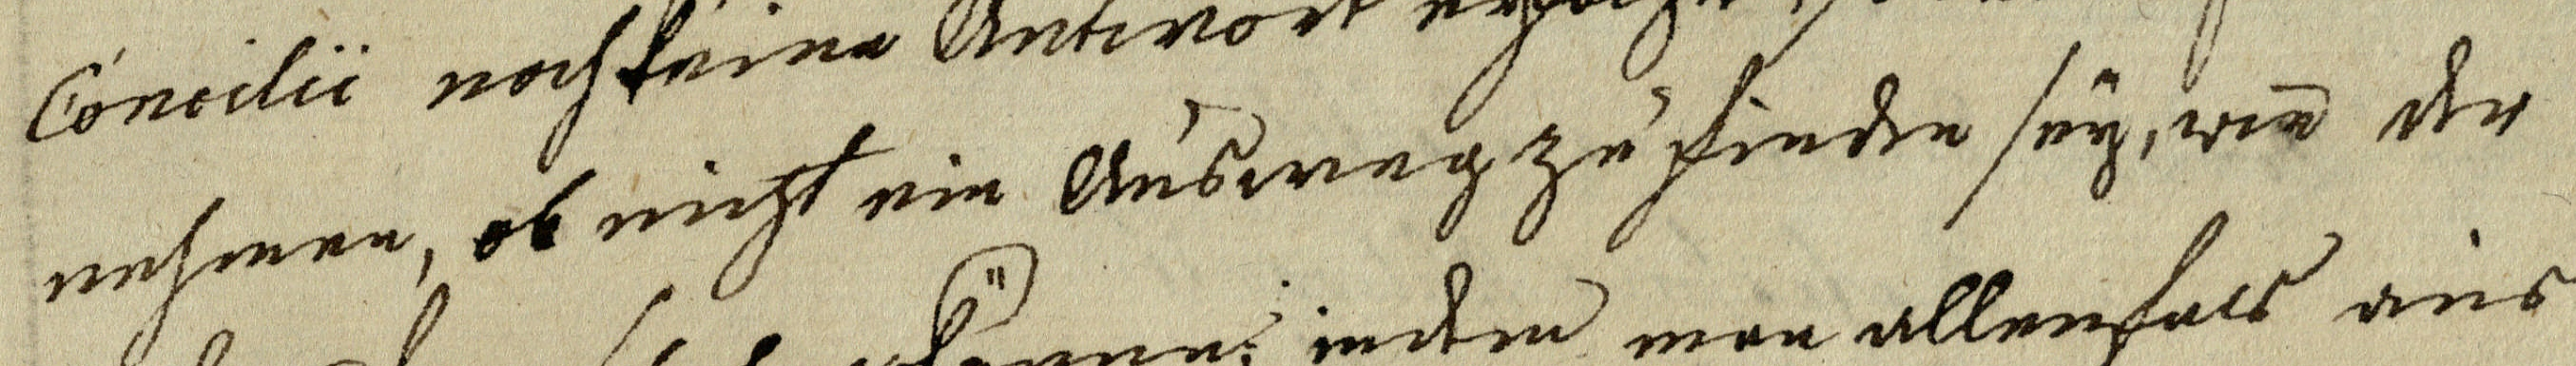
nehmen, ob nicht ein Ausweg zu finden seÿ, wie der
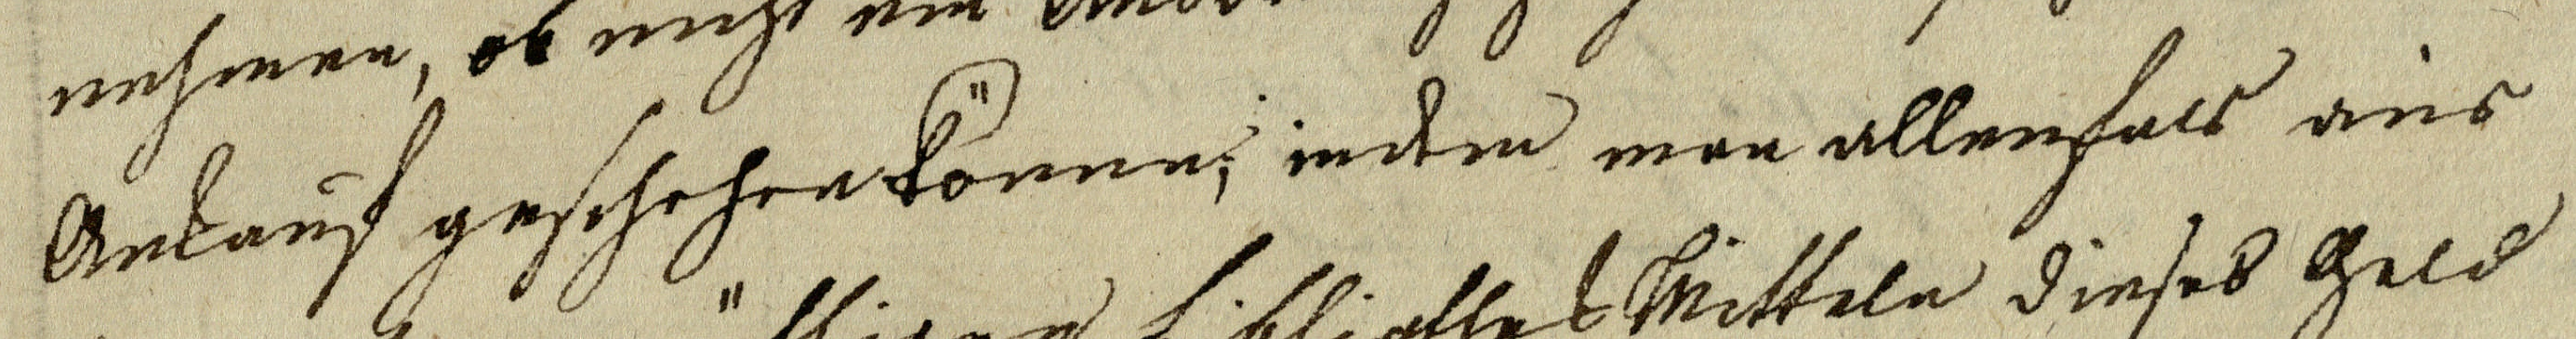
Ankauf geschehen könne, indem man allenfals aus
